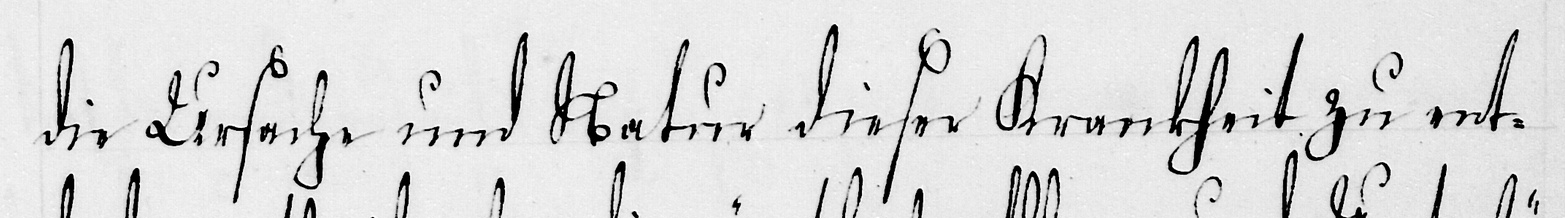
die Ursache und Natur dieser Krankheit zu ent¬
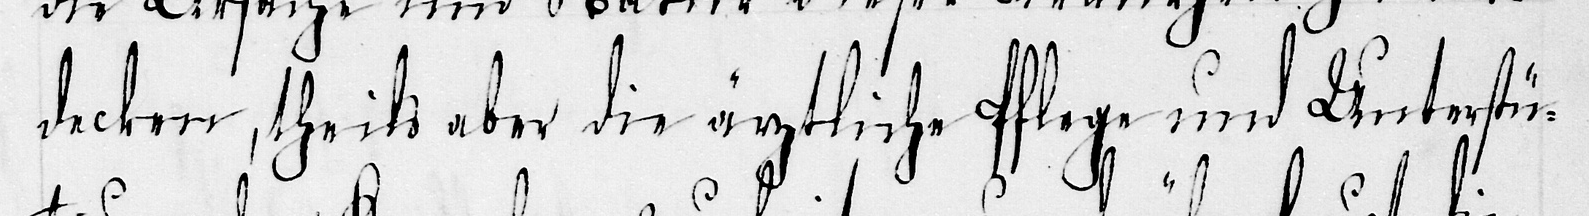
decken, theils aber die ärztliche Pflege und Unterstü¬
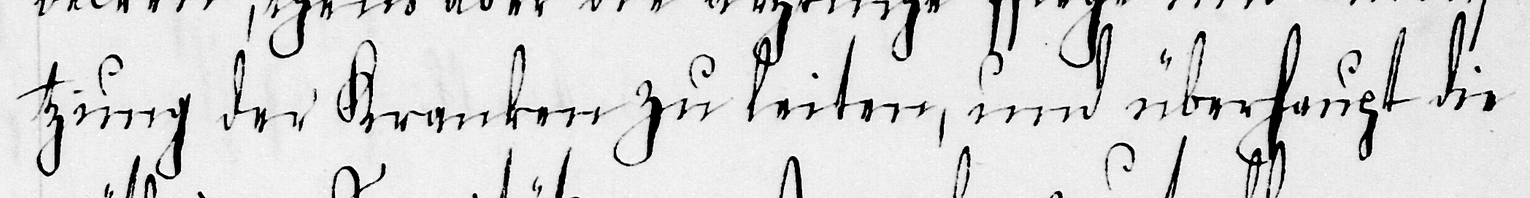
tzung der Kranken zu leiten, und überhaupt die
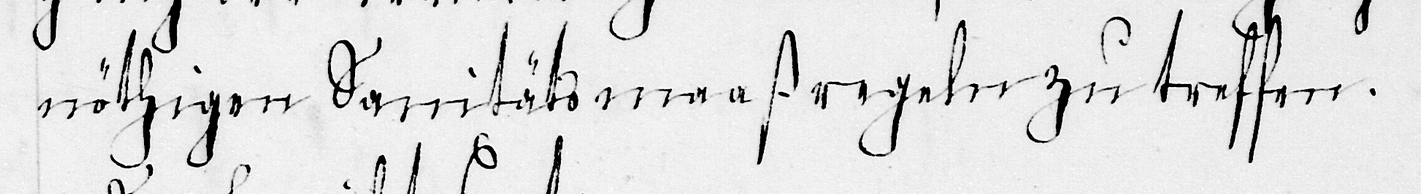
nöthigen Sanitätsmaaßregeln zu treffen.
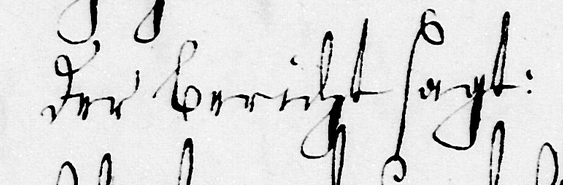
Der Bericht sagt:
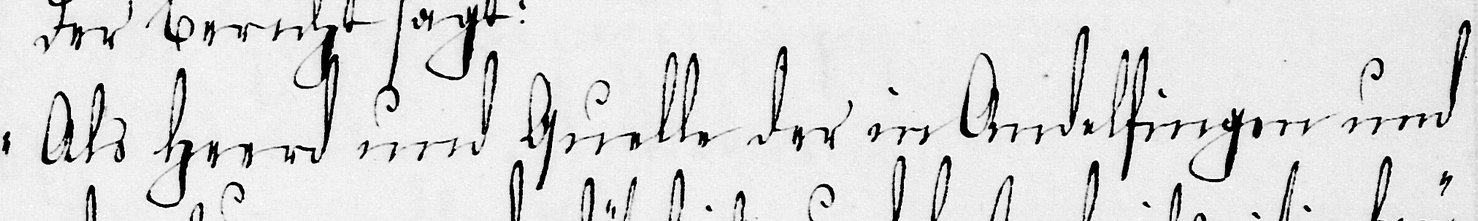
„Als Heerd und Quelle der in Andelfingen und
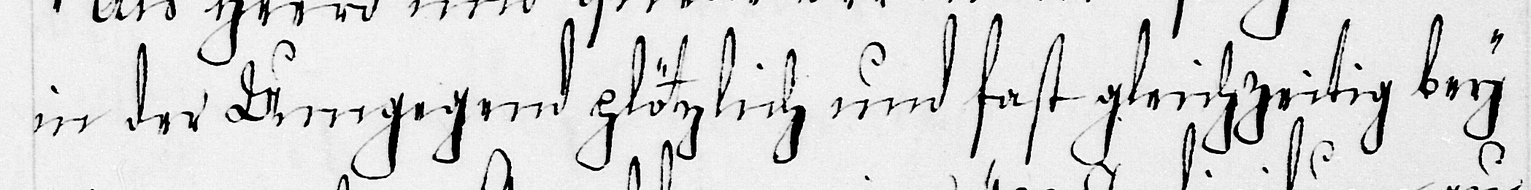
in der Umgegend plötzlich und fast gleichzeitig bey
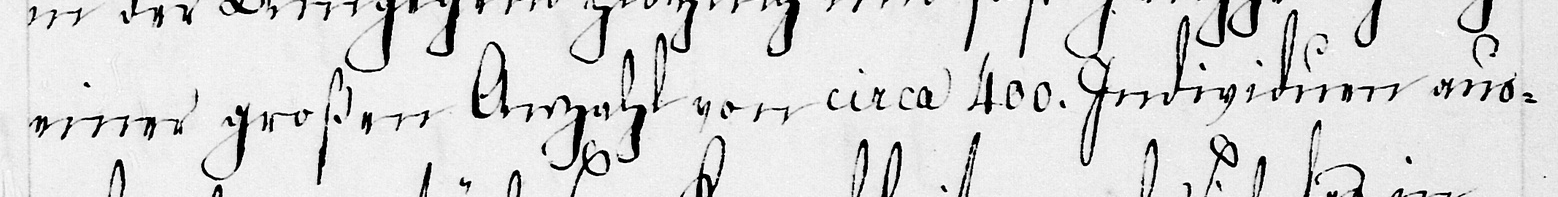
einer großen Anzahl von circa 400. Individuen aus¬
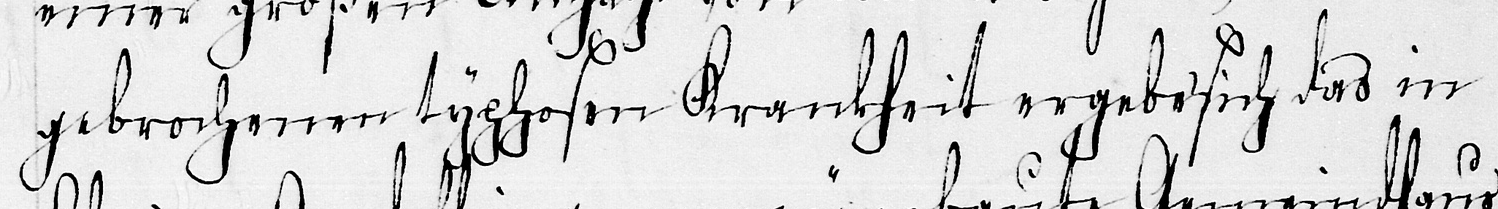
gebrochenen typhosen Krankheit ergebe sich das in
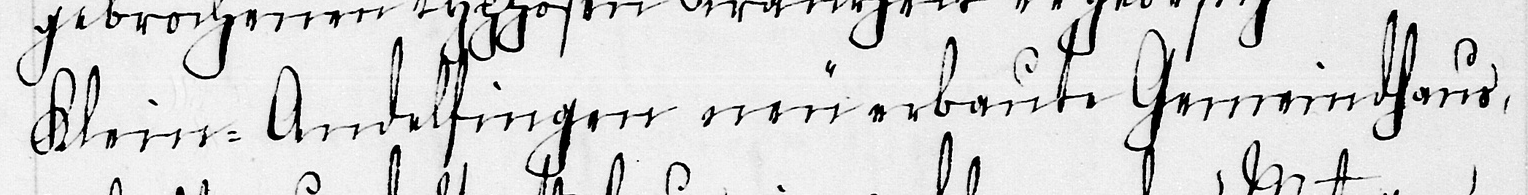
Klein-Andelfingen neu erbaute Gemeindhaus,
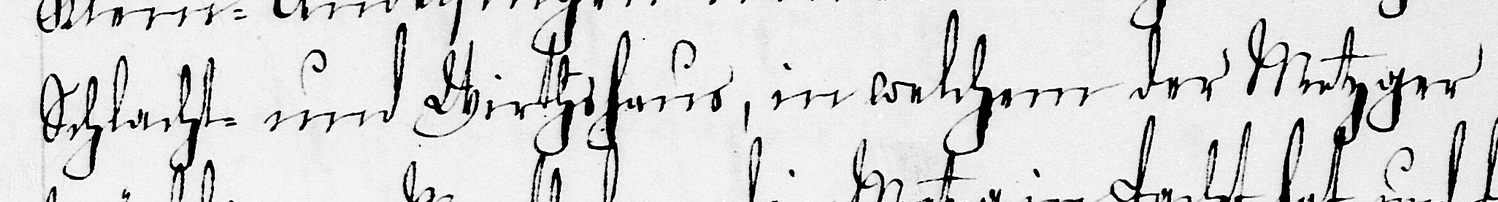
Schlacht- und Wirthshaus, in welchem der Metzger
